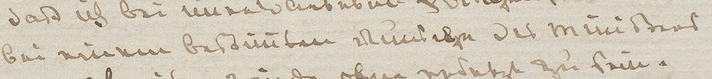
bei einem bestimmten Wunsche des Ministers
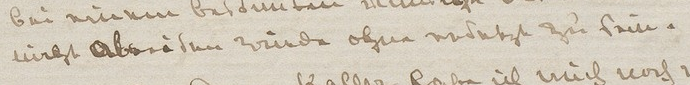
nicht abreisen würde ohne ersetzt zu sein.
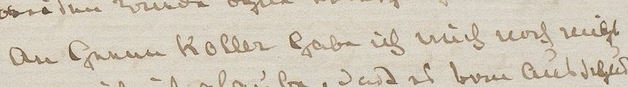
An Herrn Koller habe ich mich noch nicht
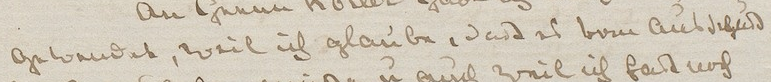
gewendet, weil ich glaube, daß es vom Ausschuß
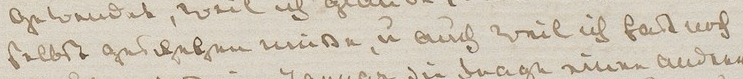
selbst geschehen müße, u auch weil ich fast noch
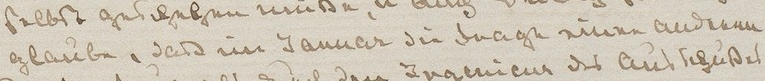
glaube, daß im Januar die Frage einer anderen
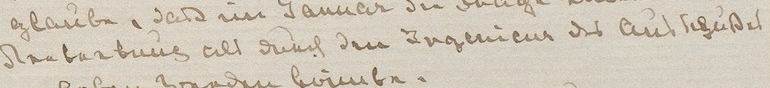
Vertretung als durch den Ingenieur des Ausschußes
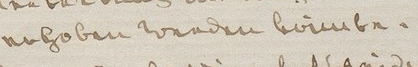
erhoben werden könnte.
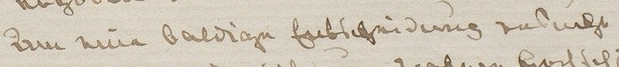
Um eine baldige Entscheidung ersucht
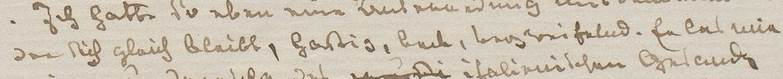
der sich gleich bleibt, hastig, keck, verzweifelnd. Er las mir
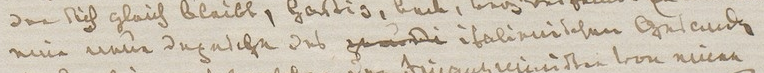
eine Depesche des preußiitalienischenGesandten
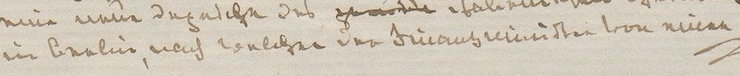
in Berlin, nach welcher der Finanzminister von einer
